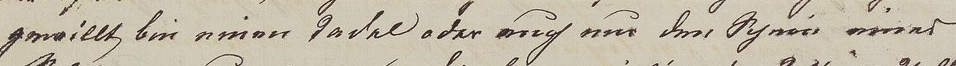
gewillt bin einen Tadel oder auch nur den Schein eines
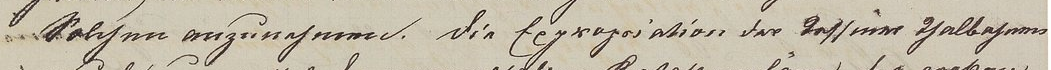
Solchen anzunehmen. Die Expropriation der Tessiner Thalbahnen
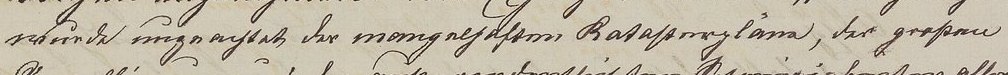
wurde ungeachtet der mangelhaften Katasterpläne, der großen
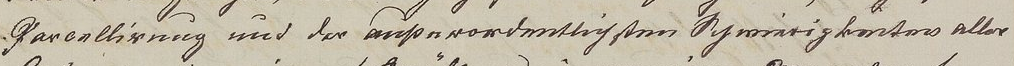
Parcellirung und der außerordentlichsten Schwierigkeiten aller
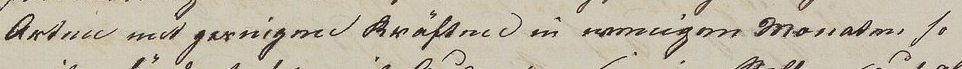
Arten mit geringen Kräften & in wenigen Monaten so
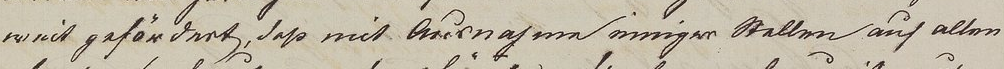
weit gefördert, daß mit Ausnahme einiger Stellen auf allen
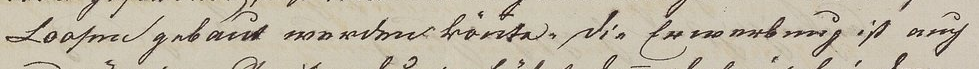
Loosen gebaut werden könnte. Die Erwerbung ist auch
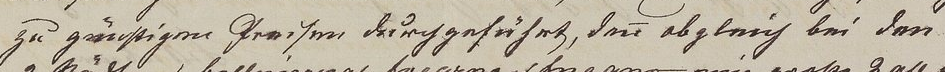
zu günstigen Preisen durchgeführt, denn obgleich bei den
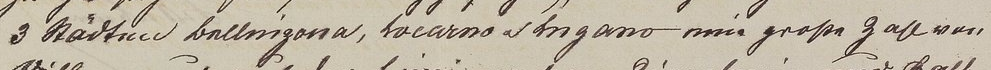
3 Städten Bellinzona, Locarno & Lugano eine große Zahl von
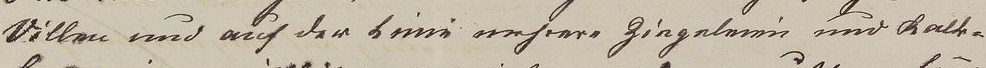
Villen und auf der Linie mehrere Ziegeleien und Kalk-
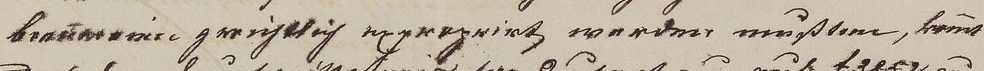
brennereien gerichtlich exproprirt werden mußten, kommt
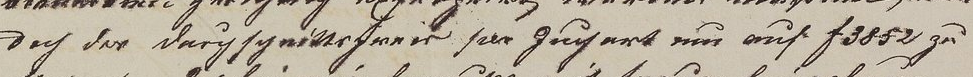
doch der Durchschnittspreis pro Juchart nur auf Fr. 3852 zu
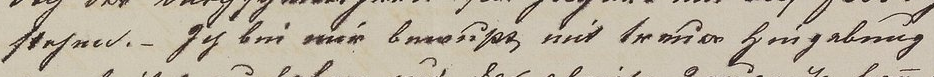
stehen. – Ich bin mir bewußt mit treuer Hingebung
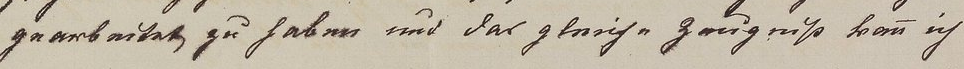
gearbeitet zu haben und das gleiche Zeugniß kann ich
